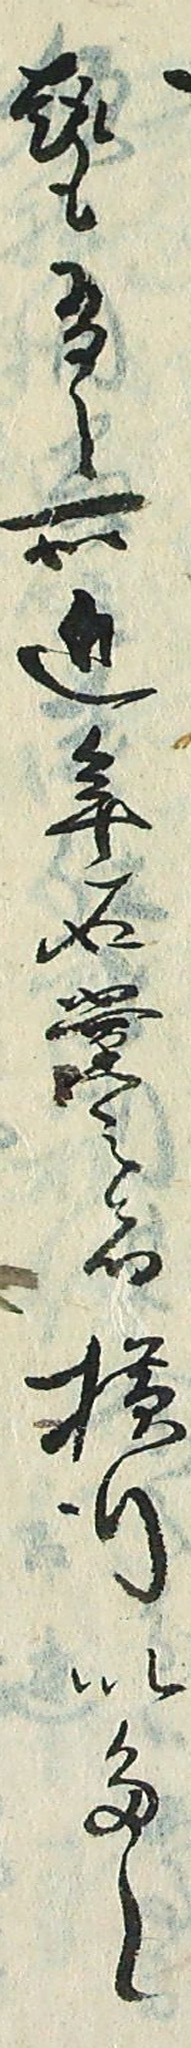趣も有之所近来右党之者横行いたし
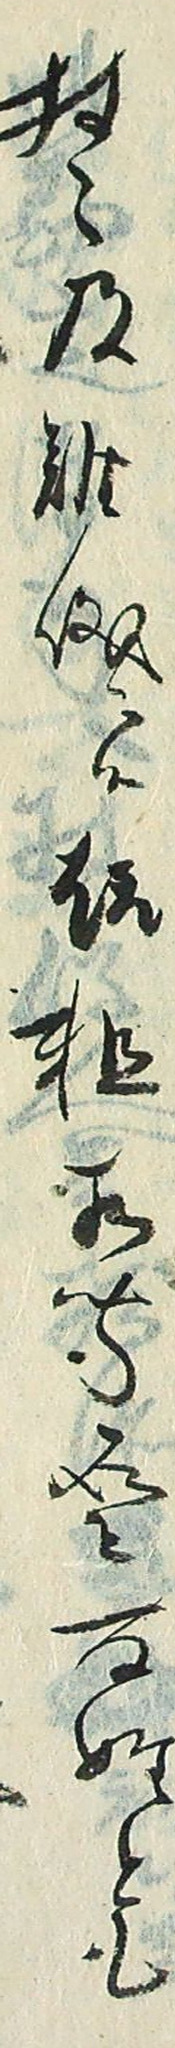村々及難儀に候趣粗相聞右を百姓とも
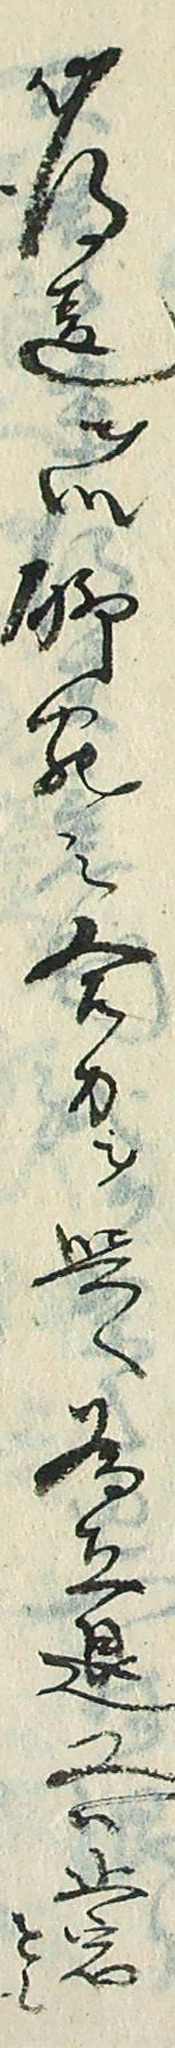心得違を以聊宛之合力を与へ為立退又は止宿をも
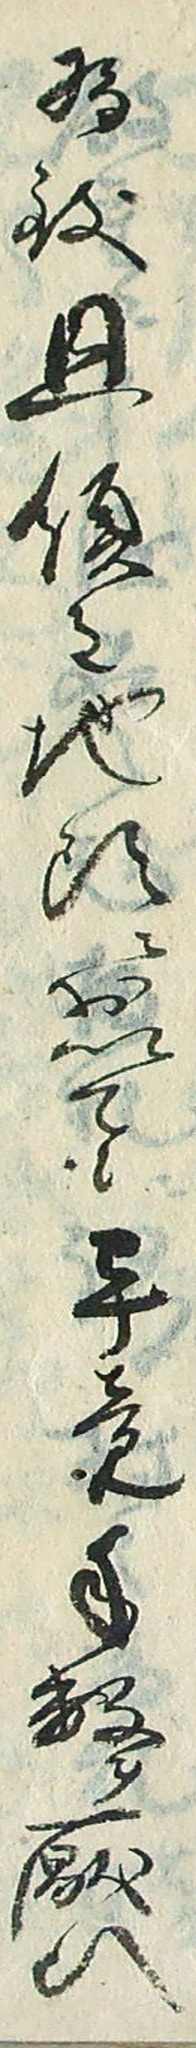為致且領主地頭においても畢竟手数を厭ひ

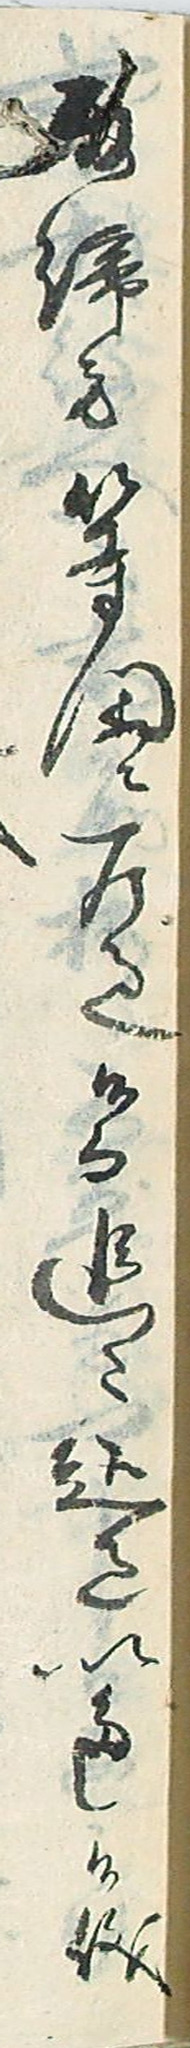取締方等閑に打過候て追々赴過いたし候儀
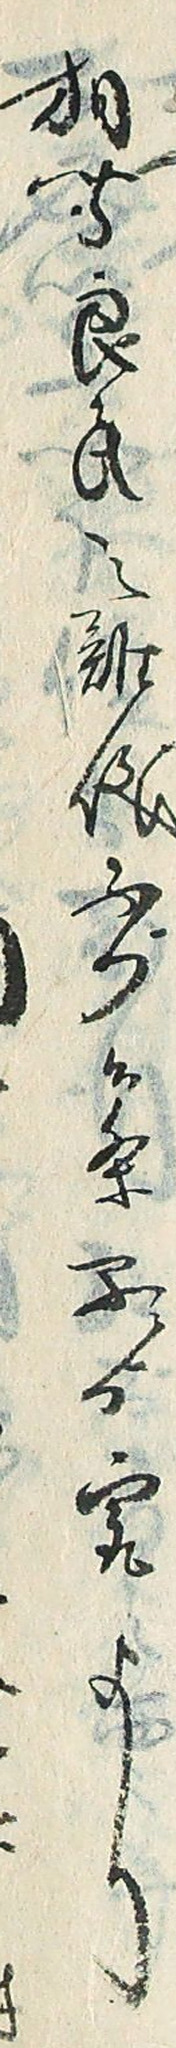相聞良民之難儀不少候条品にゟ最より
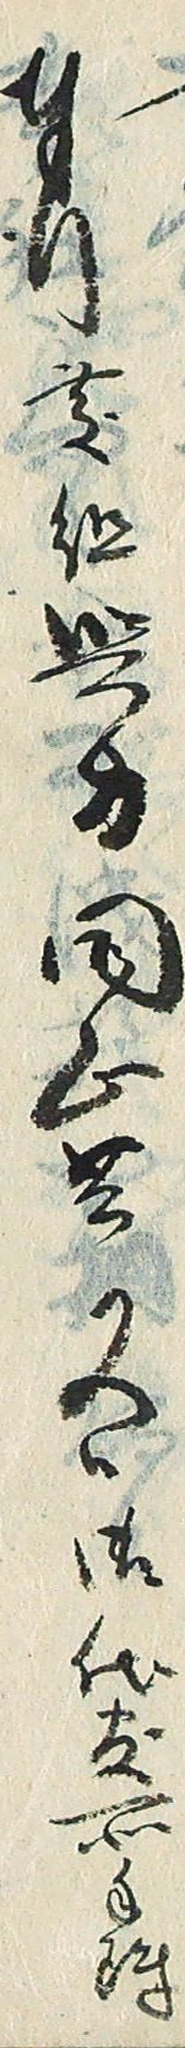奉行処組与力同心共又は御代官所手附
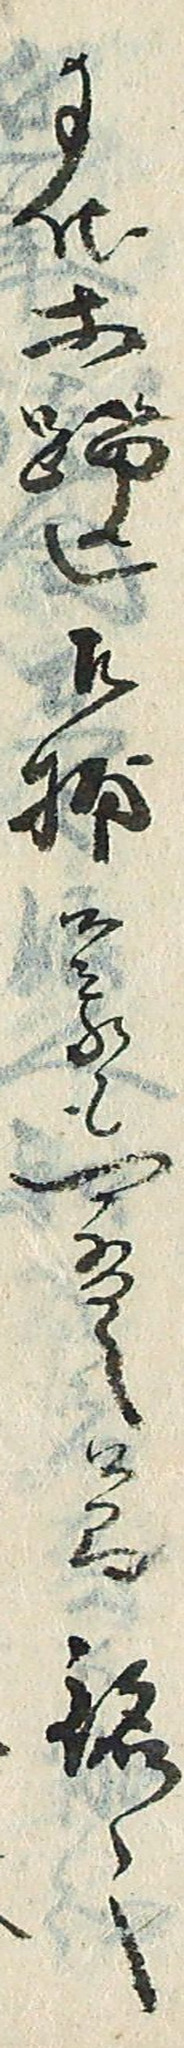手代等踏込召捕候義も可有之候間銘々
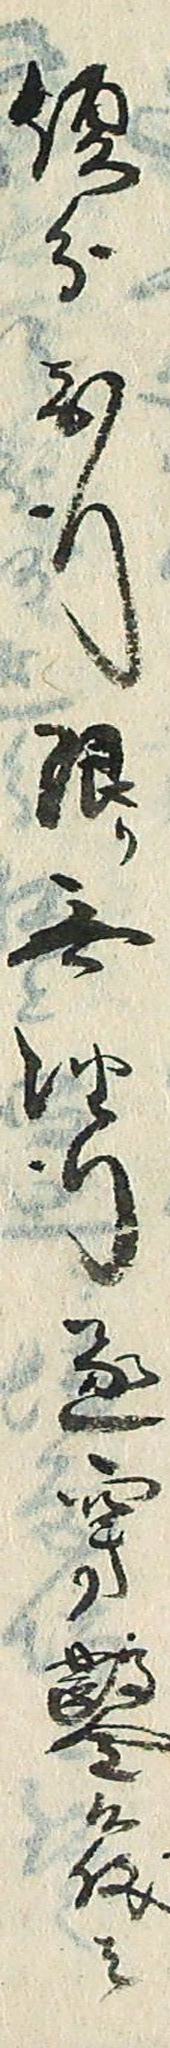領分知行限り無油断遂穿鑿候儀は
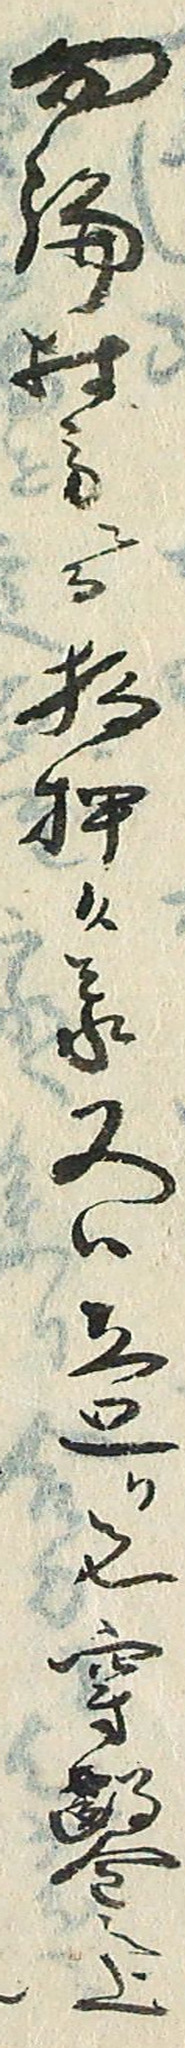勿論村方に而指押候義又は立廻り先穿鑿之上
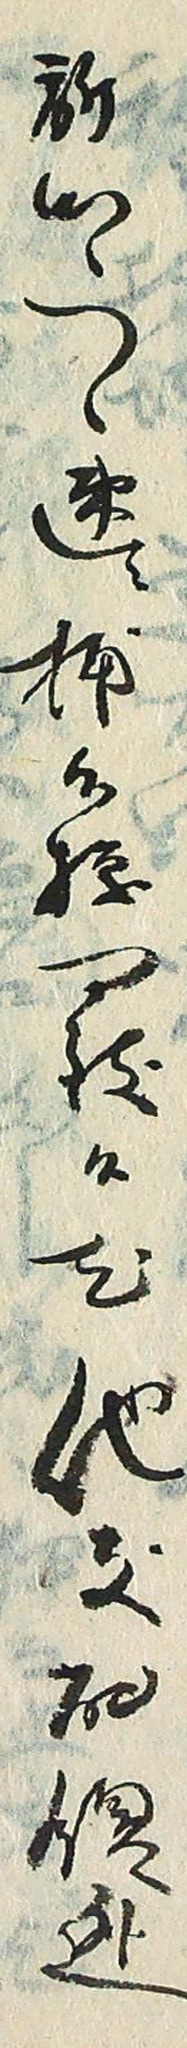訴出候はゝ速に捕候様可致候尤他支配領へ逃
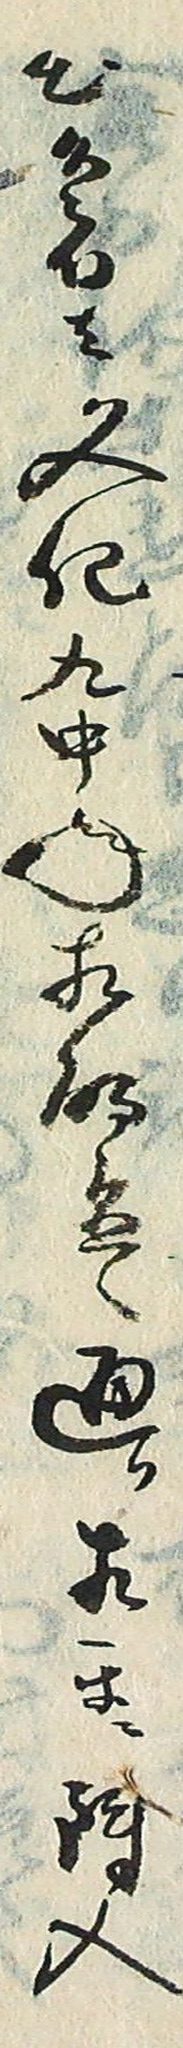出候者は文化九申年相触置候通り相互に附入
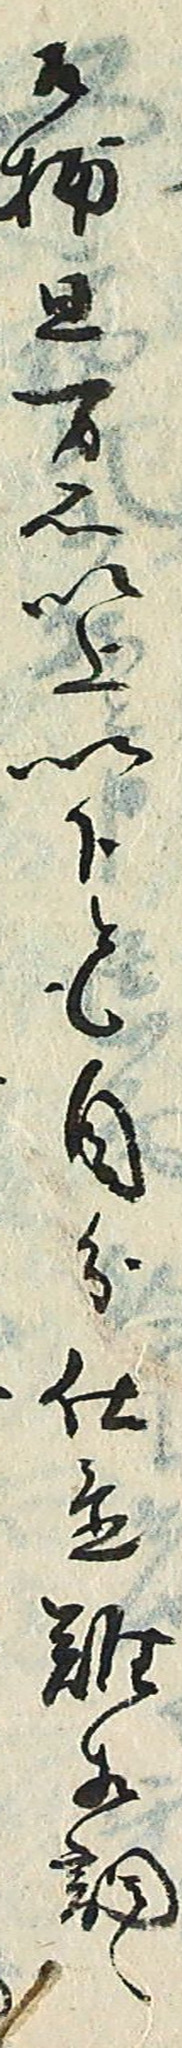召捕且万石以上以下とも自分仕置難相調候
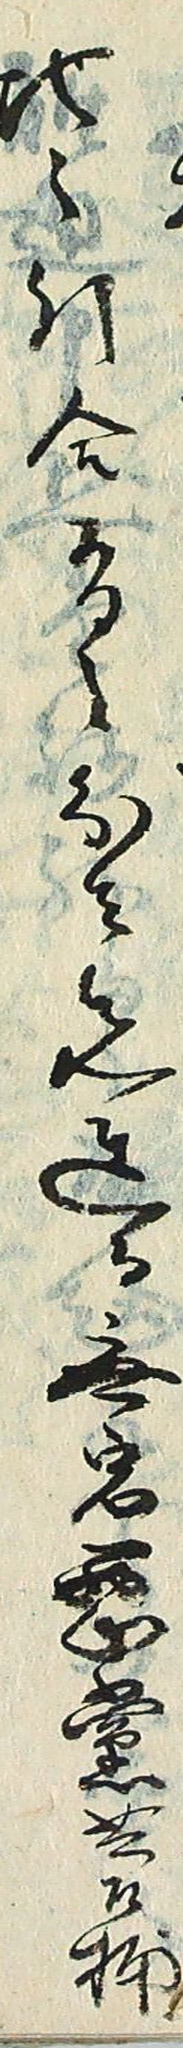地の引合有之分は先達而無宿悪党召捕
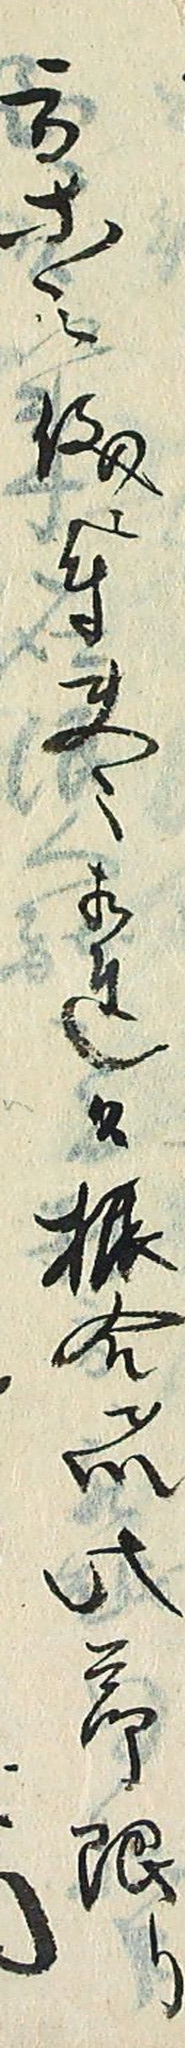方等之儀に付夫々相達候振合を以此節限り
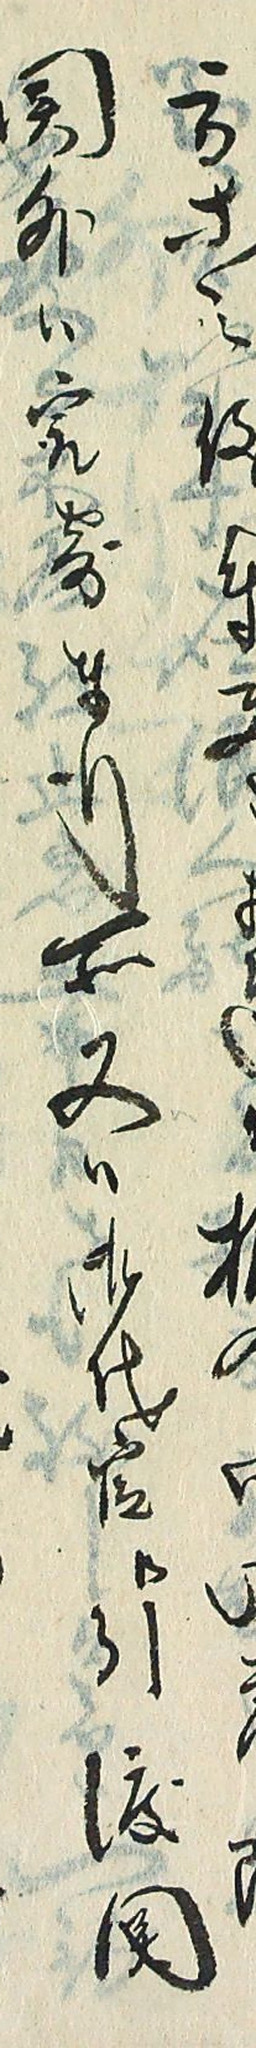関外は最寄奉行所又は御代官江引渡関
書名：諸御用御□受書控
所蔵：鳴門教育大学 Naruto University of Education
